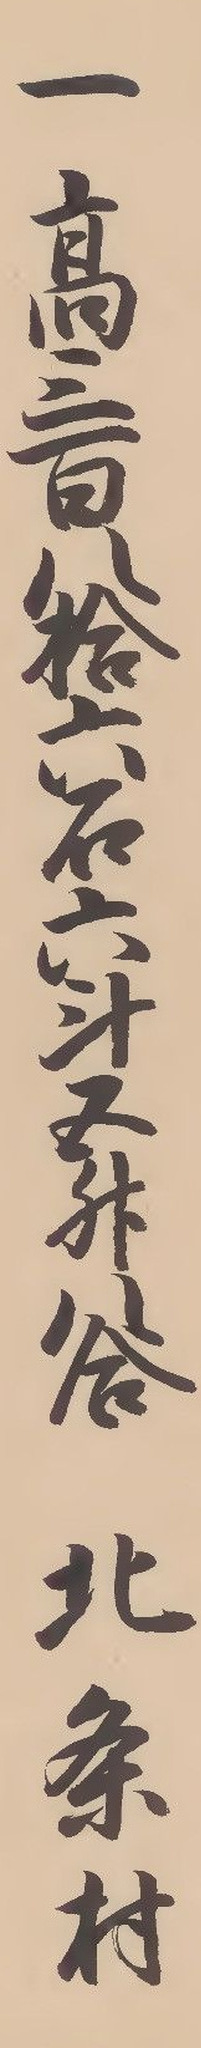一高三百八拾六石六斗五升八合北条村

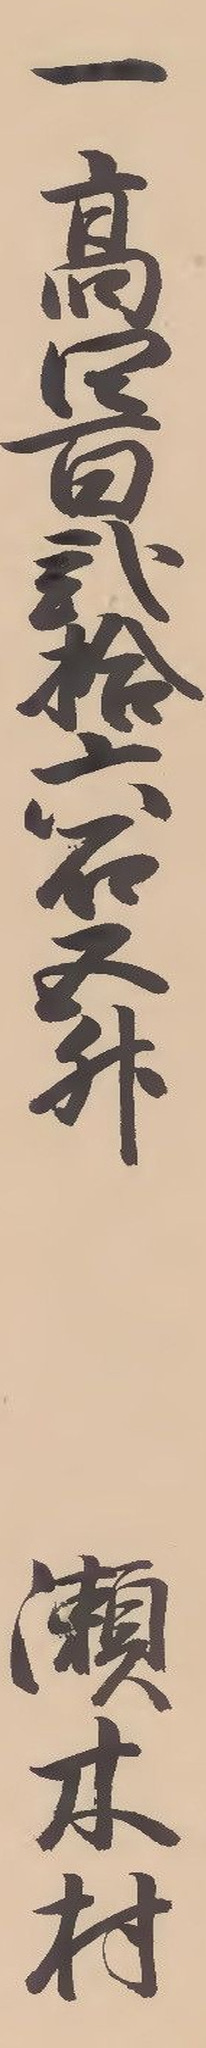一高四百弐拾六石五升瀬木村
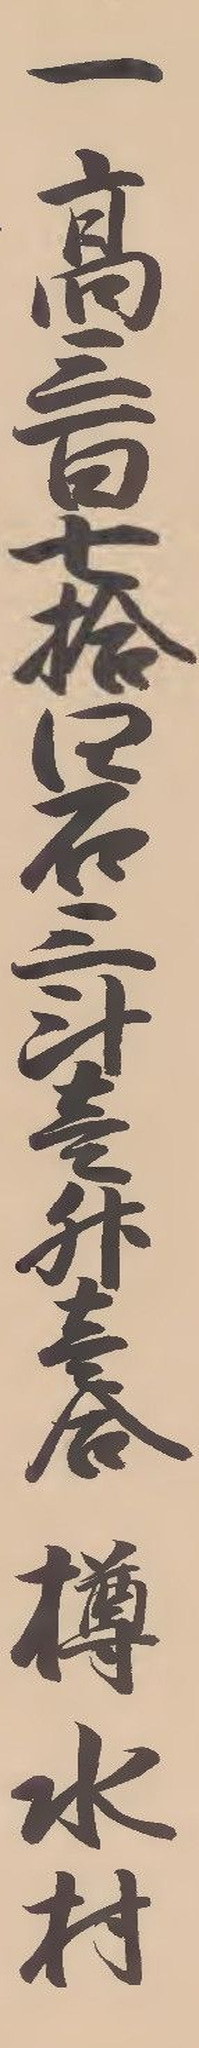一高三百七拾四石三斗壱升壱合樽水村
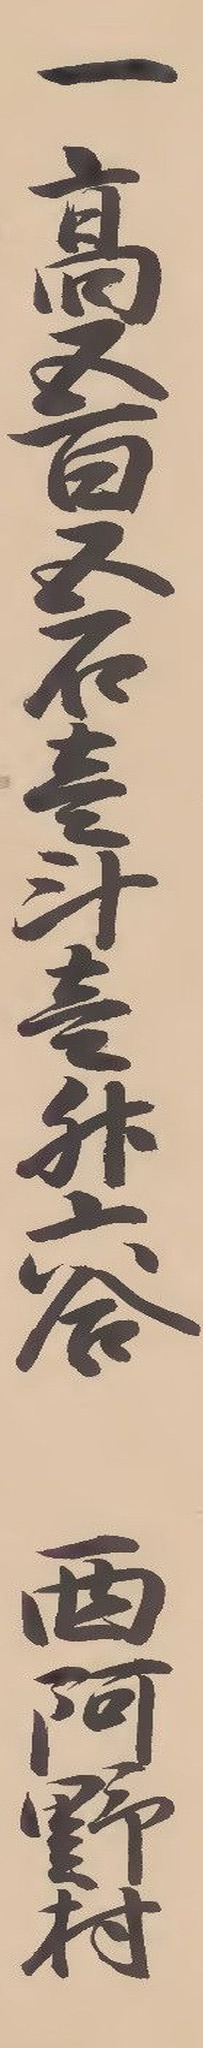一高五百五石壱斗壱升六合西阿野村
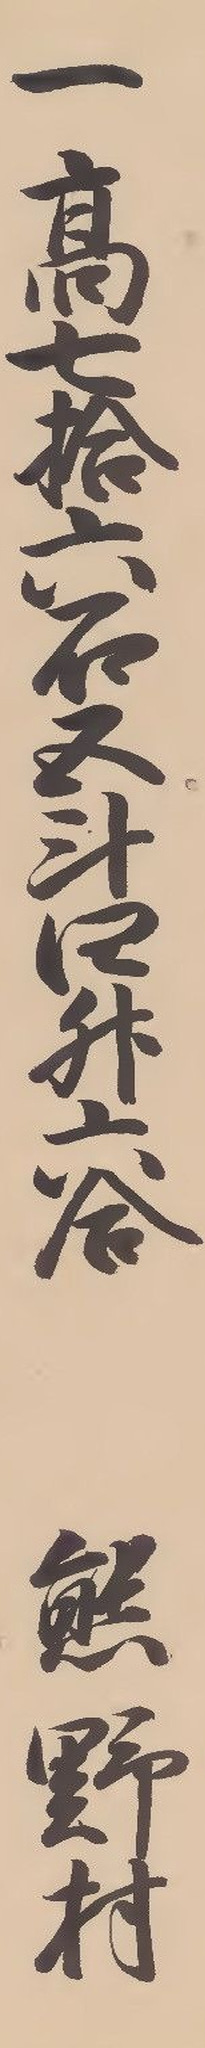一高七拾六石五斗四升六合熊野村
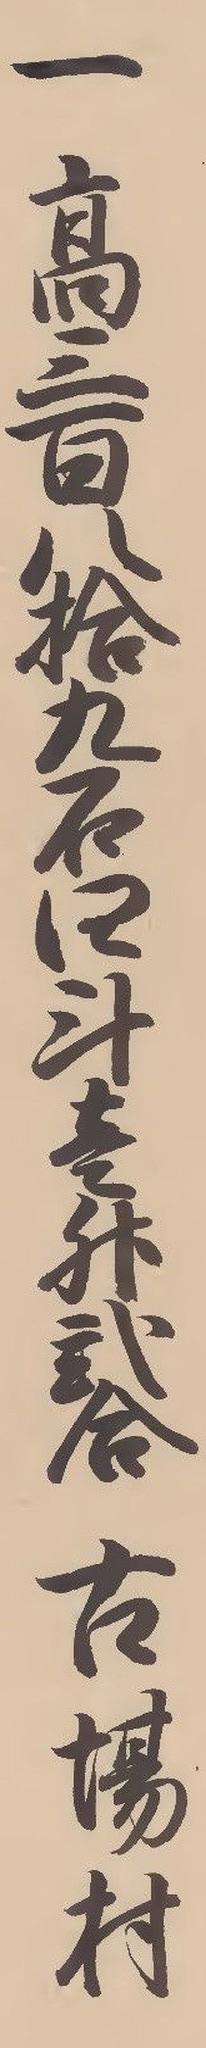一高三百八拾九石四斗壱升弐合古場村
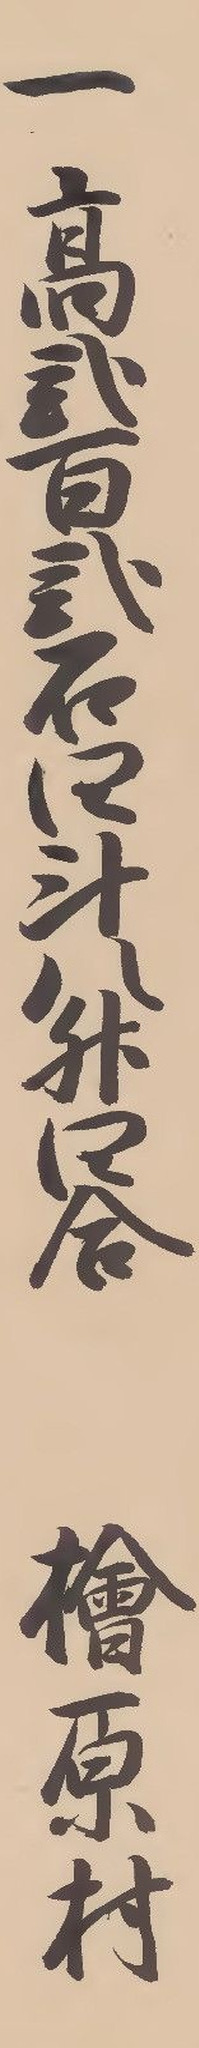一高弐百弐石四斗八升四合桧原村
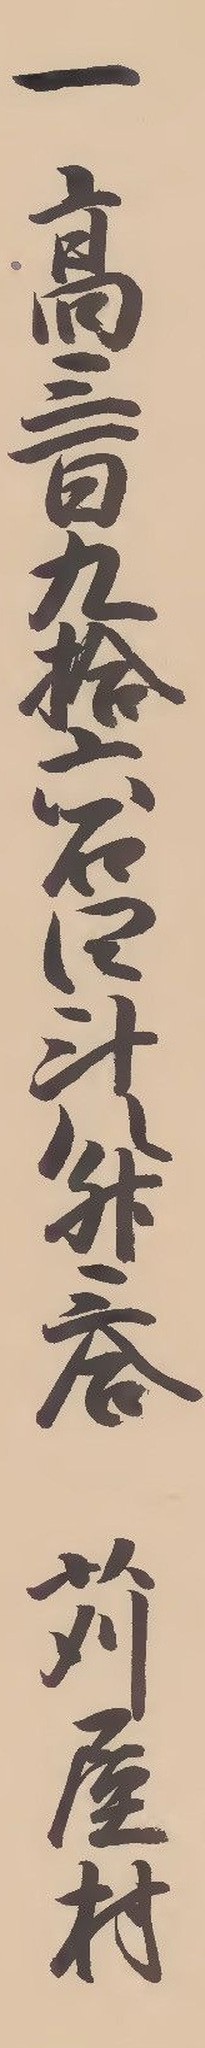一高三百九拾六石四斗八升三合苅屋村

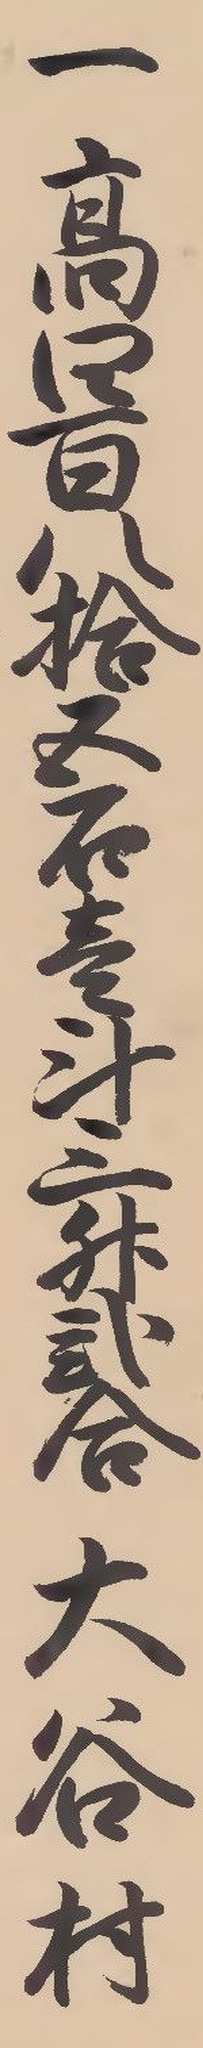一高四百八拾五石壱斗三升弐合大谷村
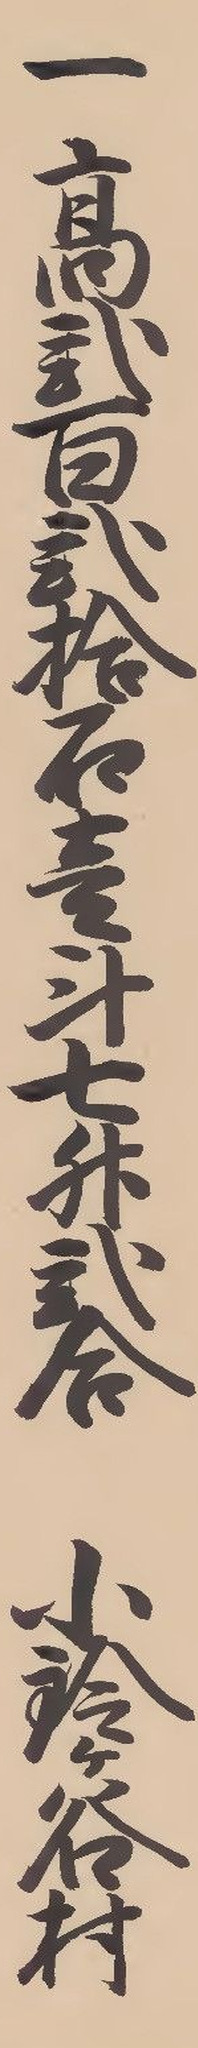一高弐百弐拾石壱斗七升弐合小鈴ヶ谷村
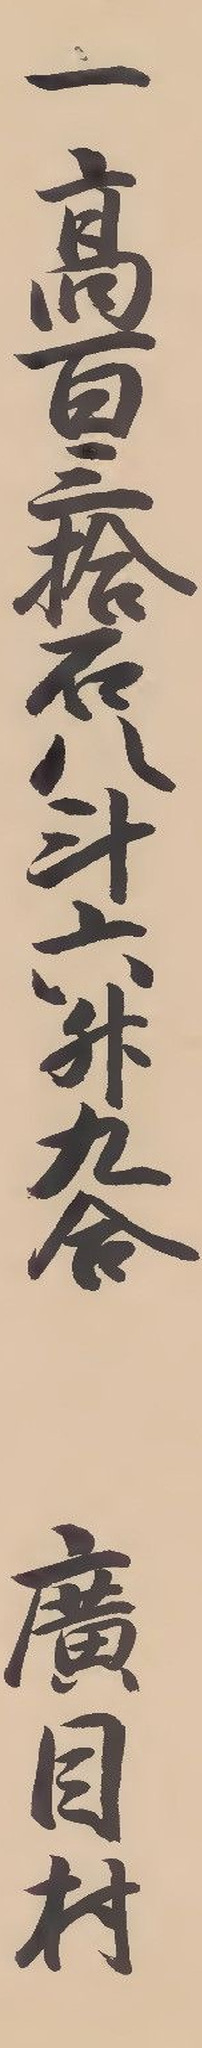一高百三拾石八斗六升九合広目村
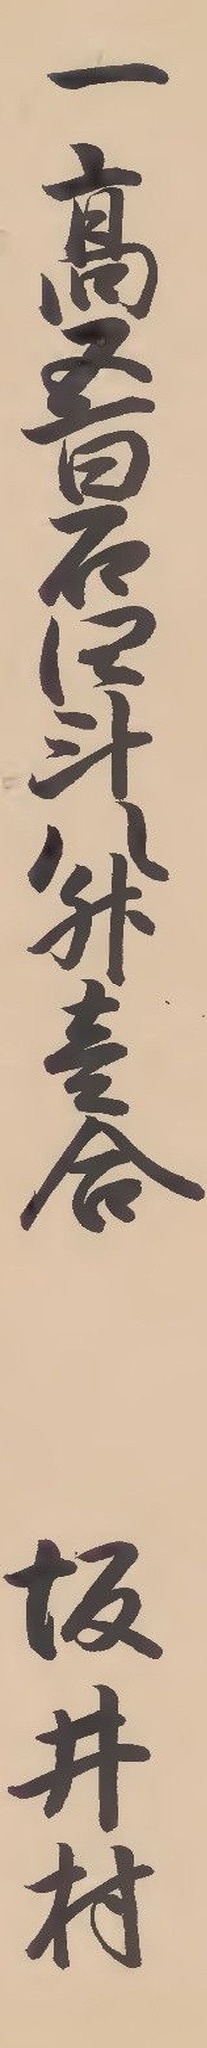一高五百石四斗八升壱合坂井村
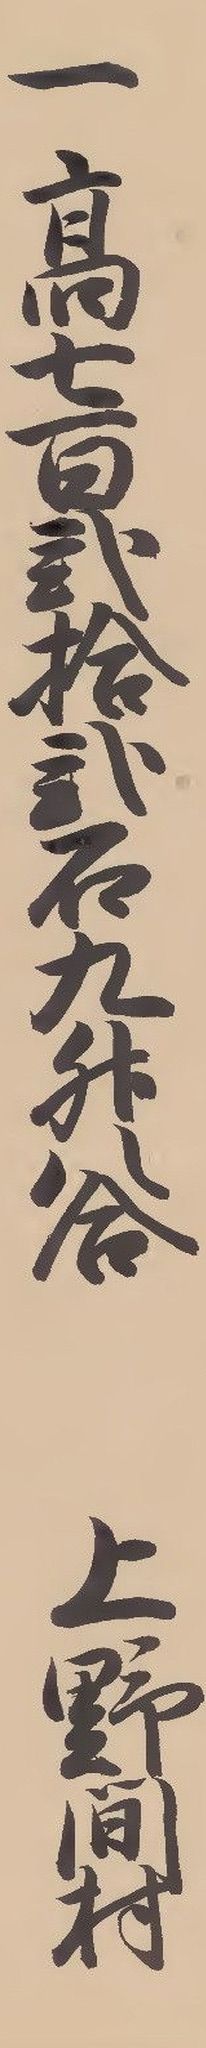一高七百弐拾弐石九升八合上野間村
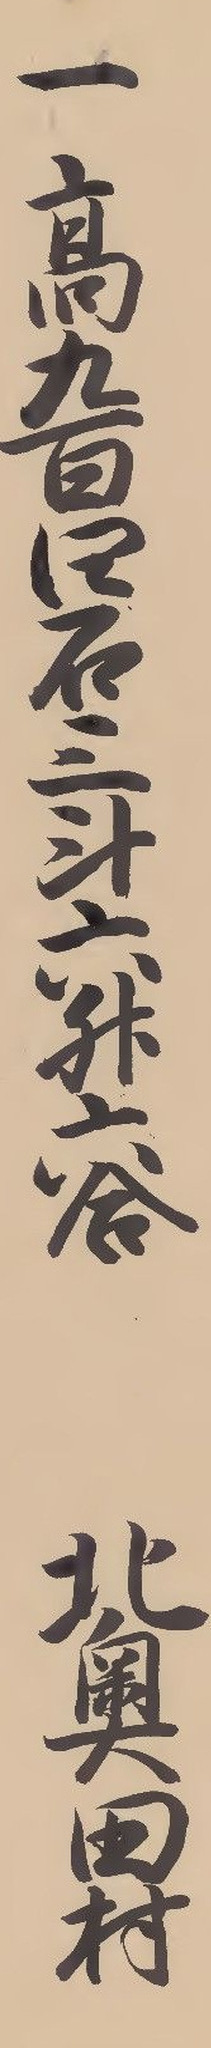一高九百四石三斗六升六合北奥田村
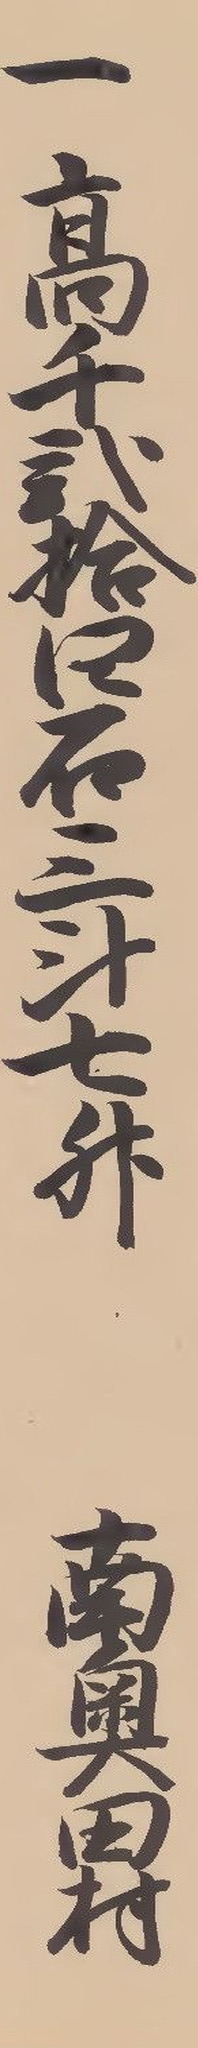一高千弐拾四石三斗七升南奥田村
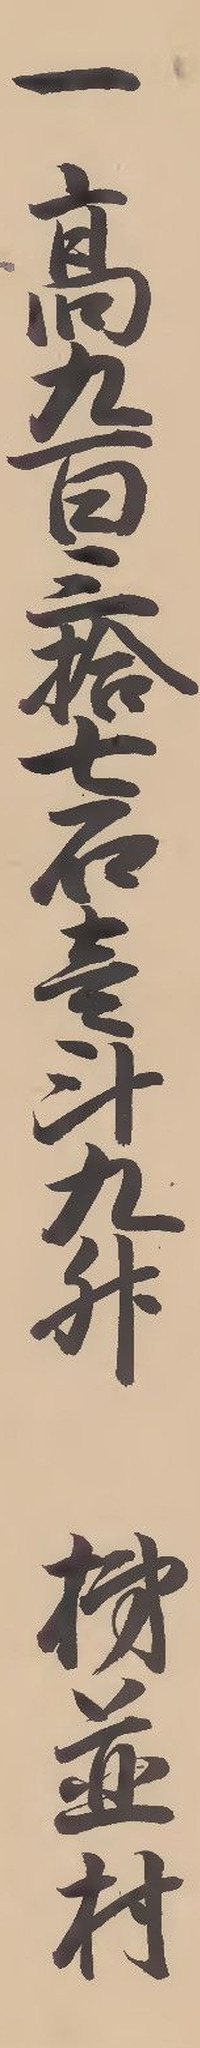一高九百三拾七石壱斗九升柿並村
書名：尾張国郷帳
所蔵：国立公文書館 National Archives of Japan
